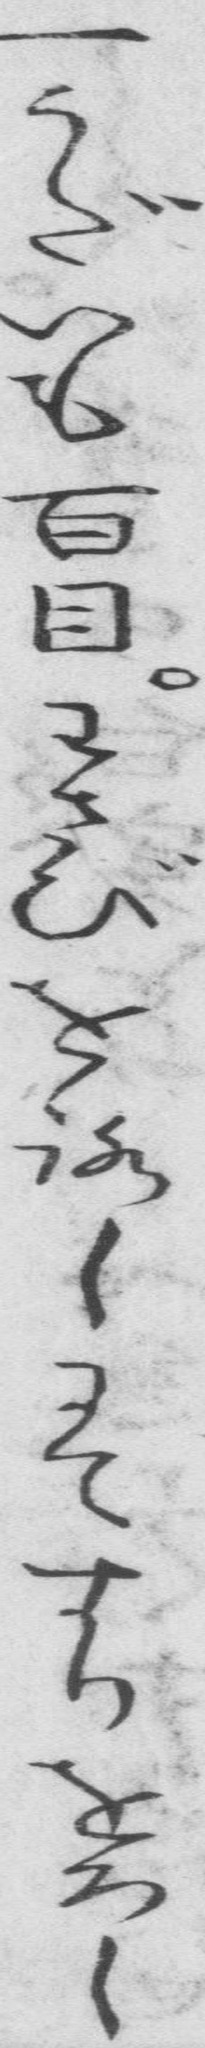一うだいも百目。わさびをろしにてすりをろし
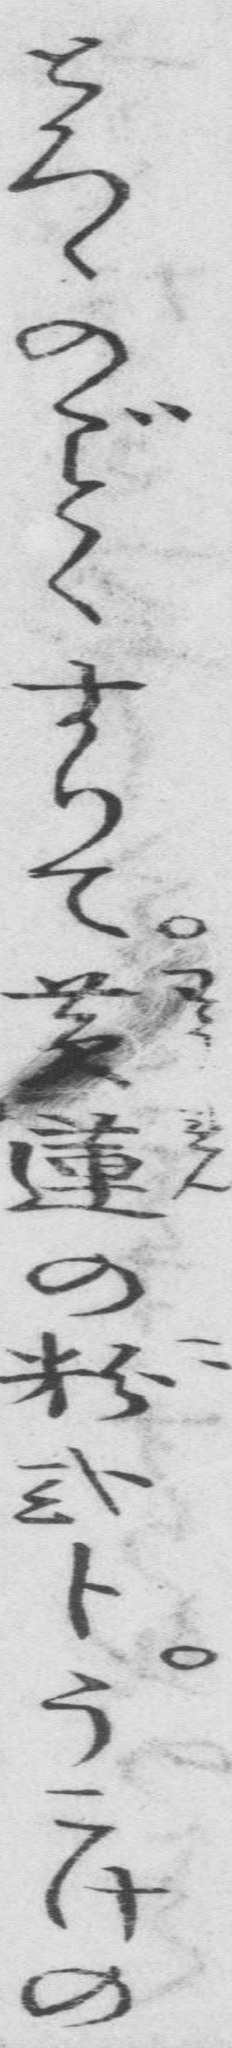とろゝのごとくすりて。黄蓮の粉弐分。うこけの
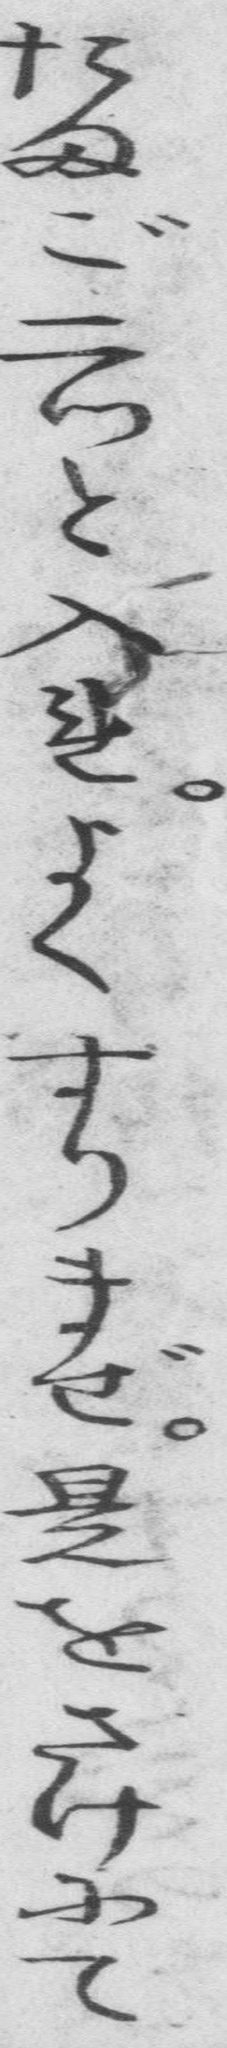たまご二ツと入れ。よくすりまぜ。是をさけにて
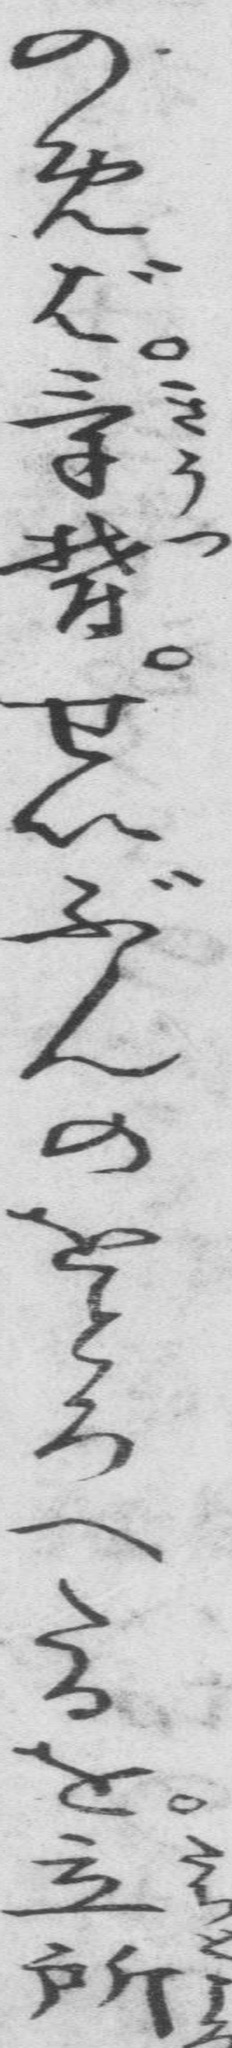のめば。気鬱。せいぶんのをとろへたるを。立所
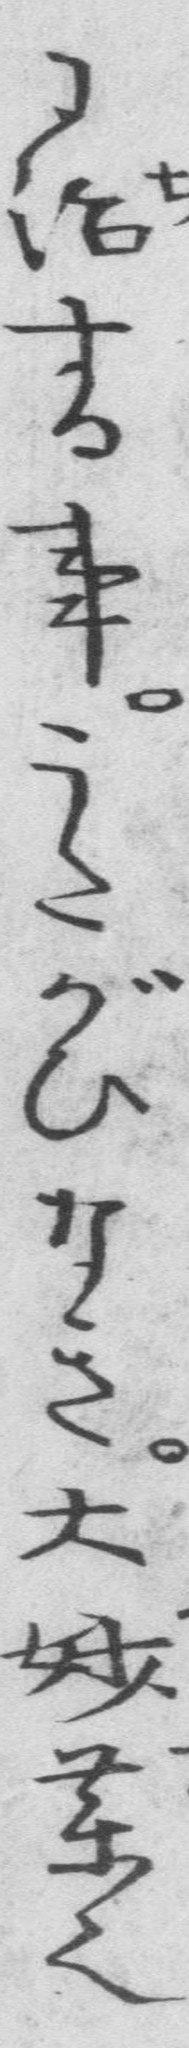に治する事。うたがひなき。大妙薬也

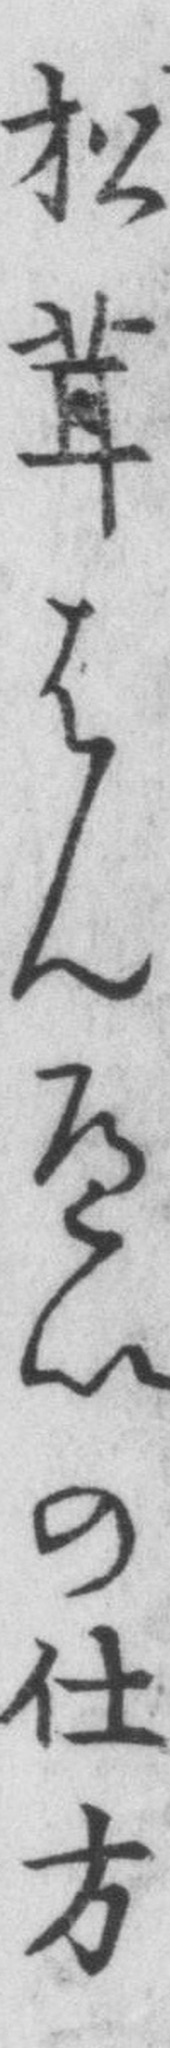松茸はんへいの仕方
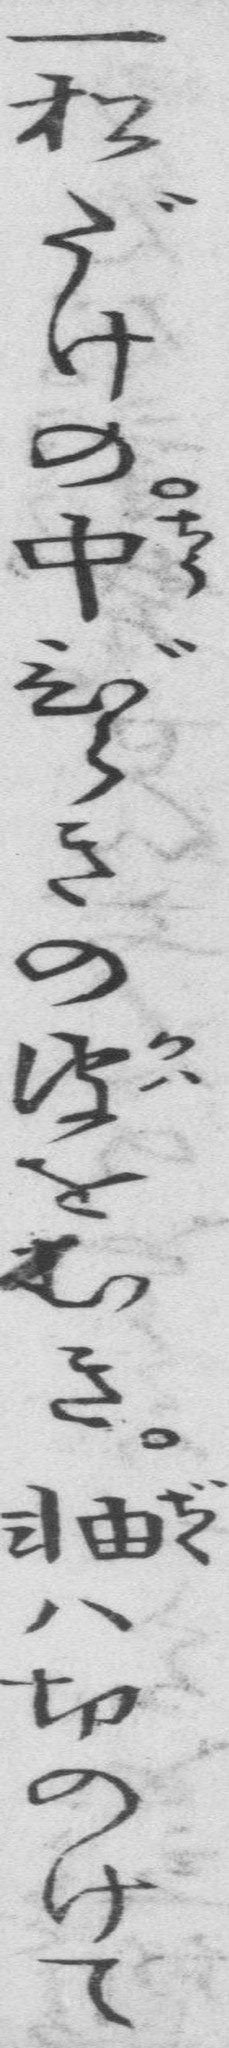一松だけの。中びらきの皮をむき。軸は切のけて
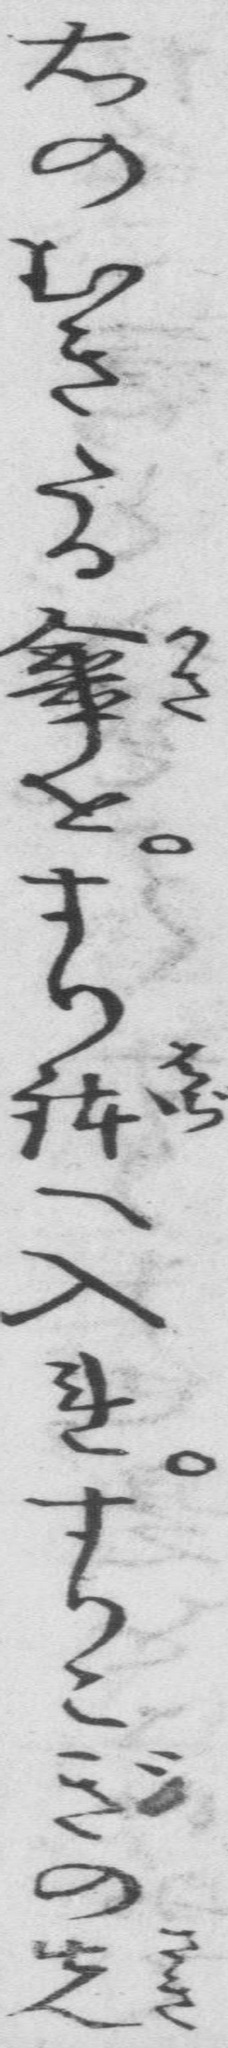右のむきたる傘を。すり鉢へ入れ。すりこぎの先
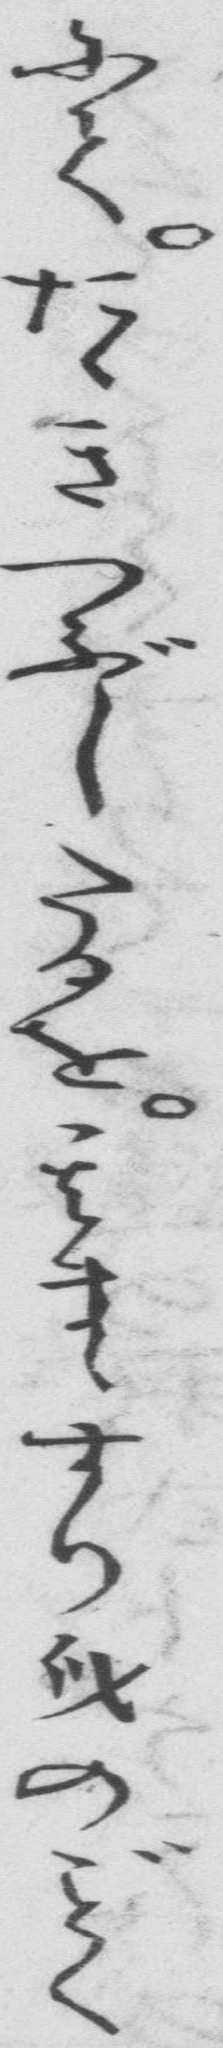にて。たゝきつぶしたるを。其まゝすり身のごとく
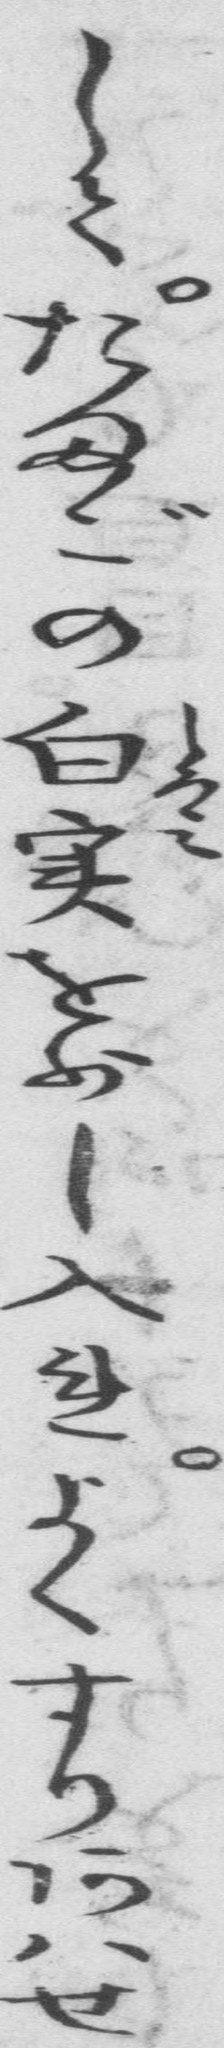して。たまごの白実を少し入れ。よくすりあはせ
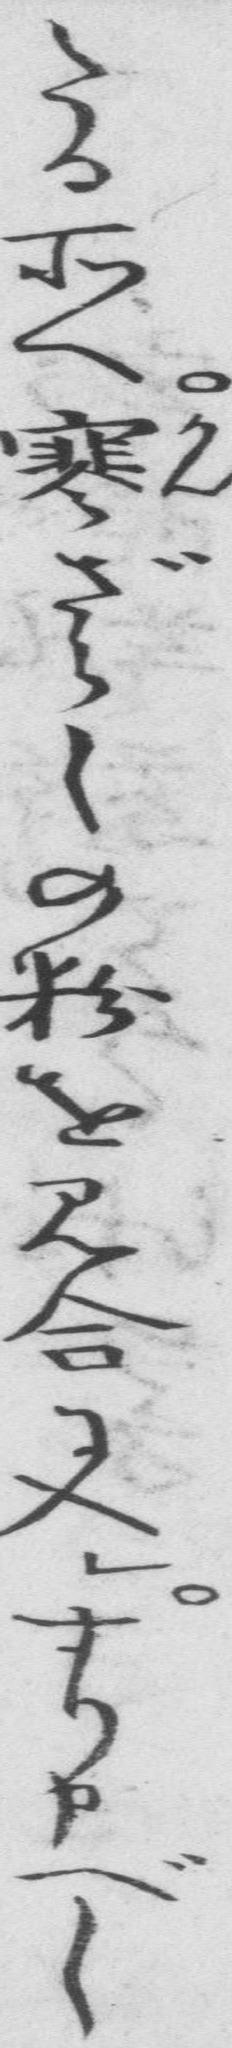たる所へ。寒ざらしの粉を見合に入れ。すり申べし
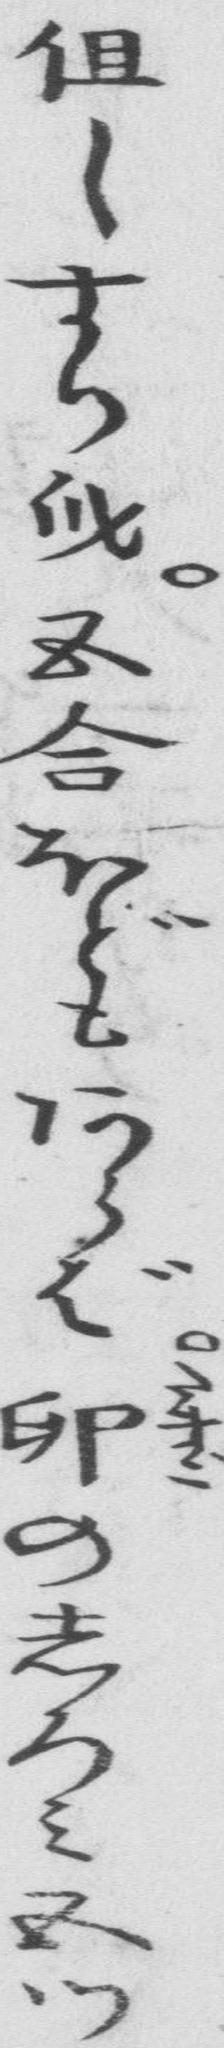但しすり身。五合ほどもあらば。卵のしろみ五ツ
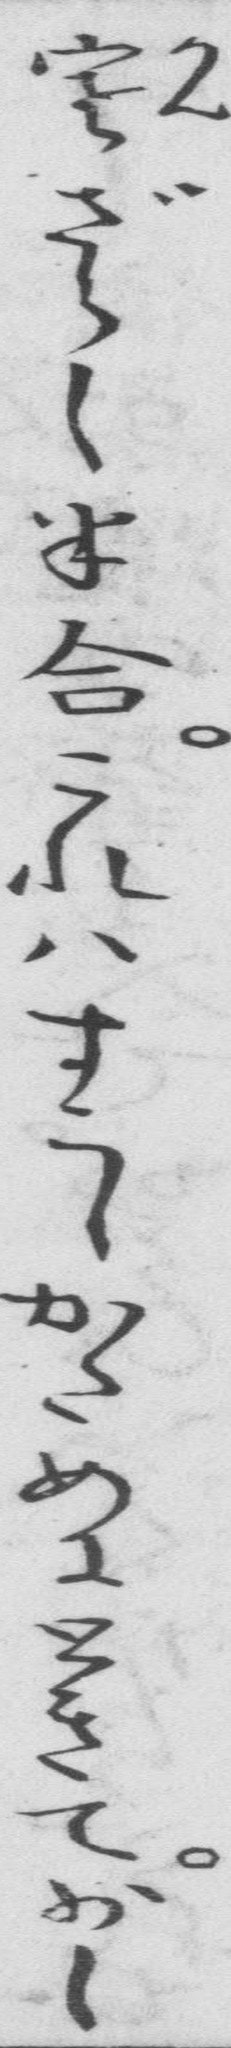寒ざらし半合。これはすこしかためにときて。少し
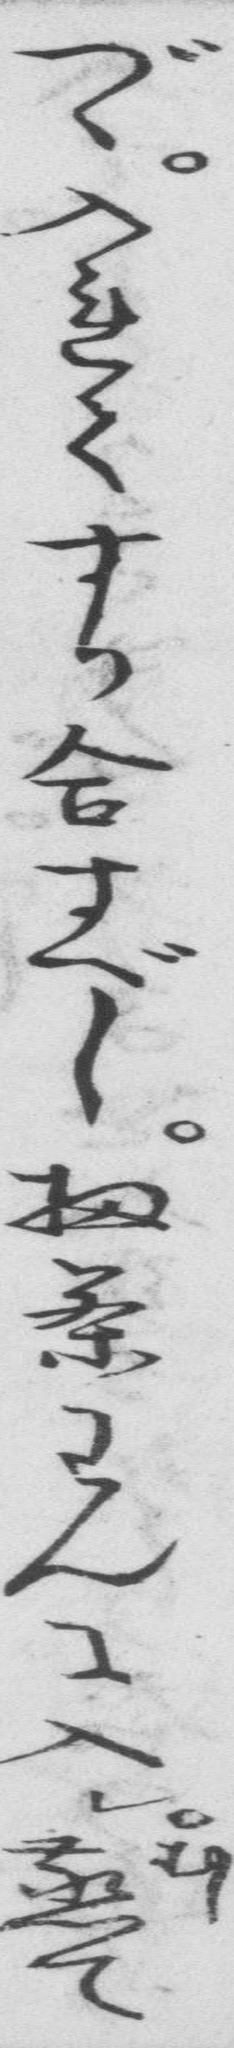づゝ。入れてすり合すべし。扨茶わんに入れ。蒸て
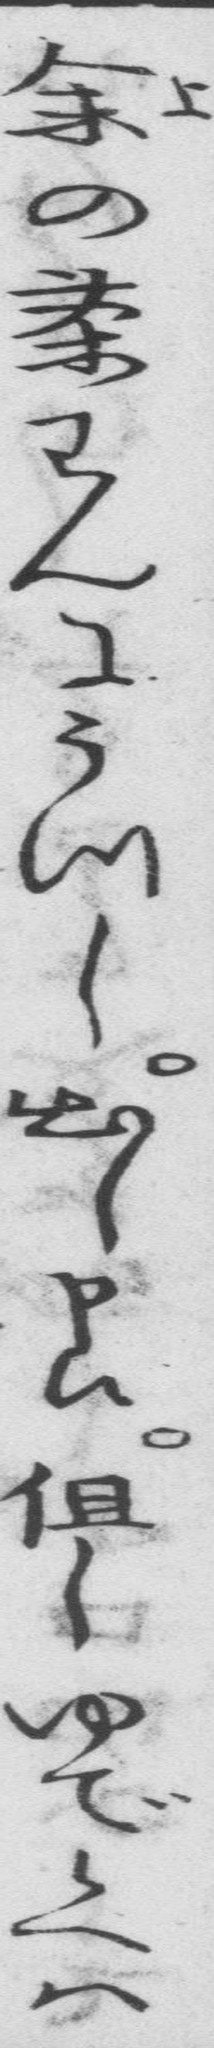余の茶わんにうつし。出し申候。但しゆで候へは
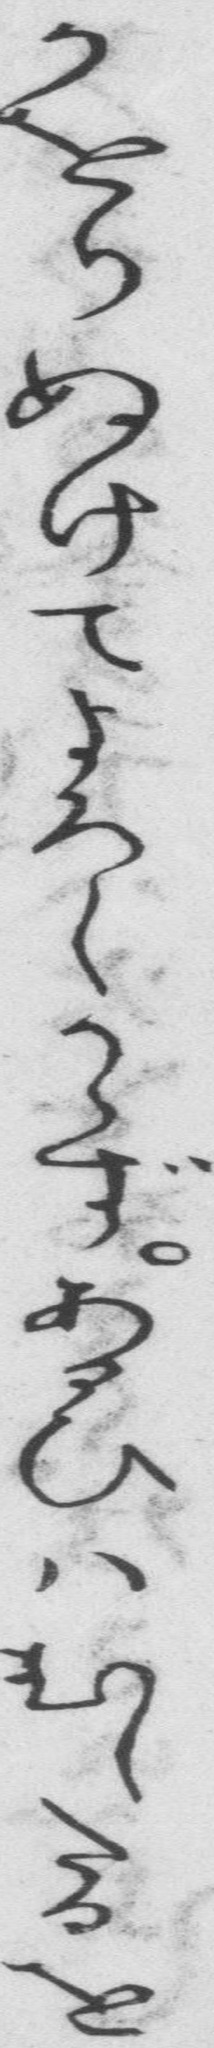かをりぬけてよろしからず。あるひはむしたるを
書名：萬寳料理秘密箱
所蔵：大阪府立大学学術情報センター 国文学研究資料館
